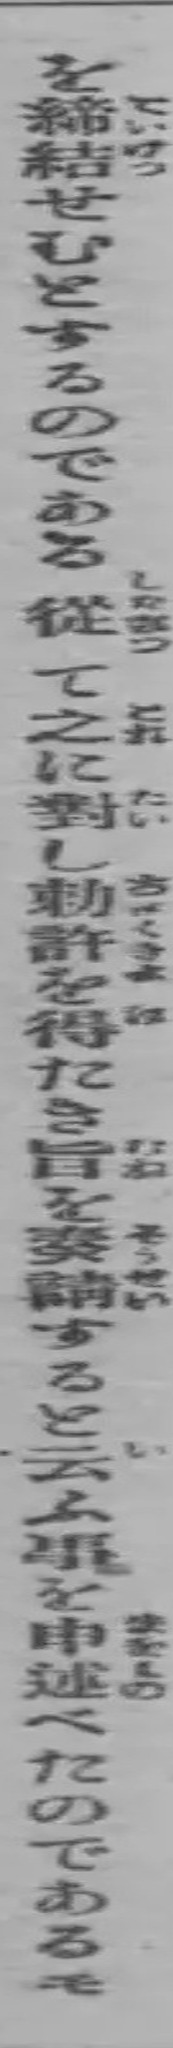を締結せむとするのである従て之に対し勅許を得たき旨を奏請すると云ふ事を申述べたのであるモ

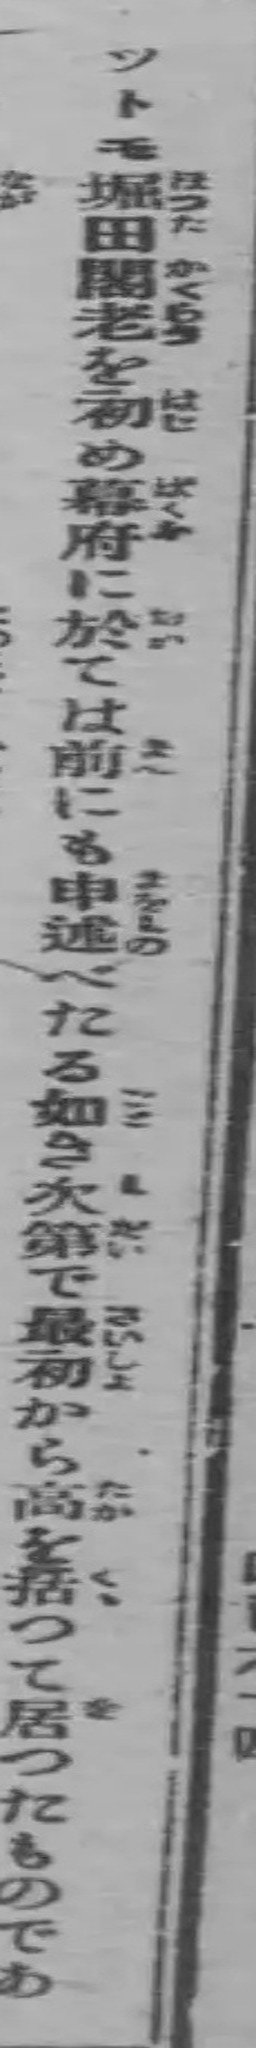ツトモ堀田閣老を初め幕府に於ては前にも申述べたる如き次第で最初高を括つて居つたものであ
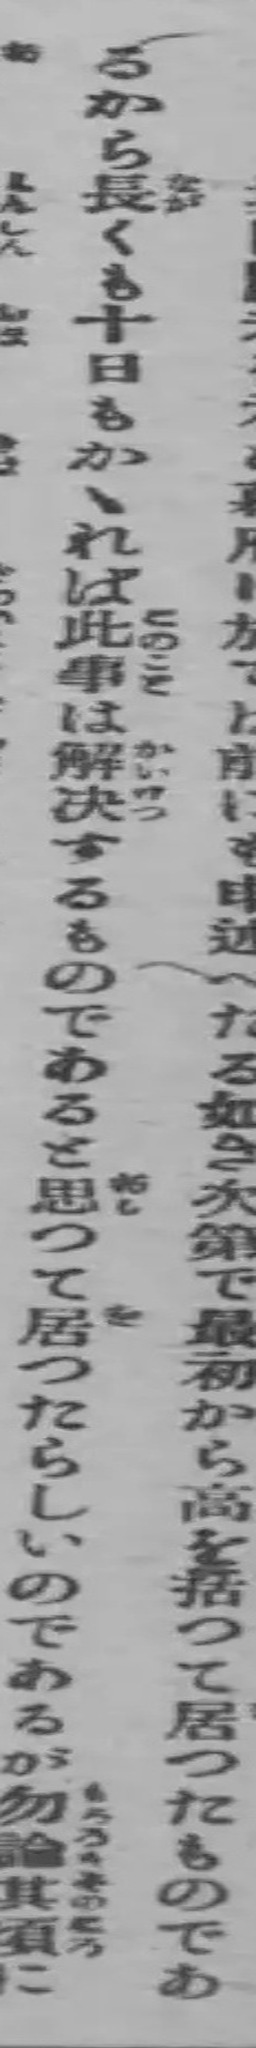るから長くも十日もかゝれば此事は解決するものであると思つて居つたらしいのであるが勿論其頃に
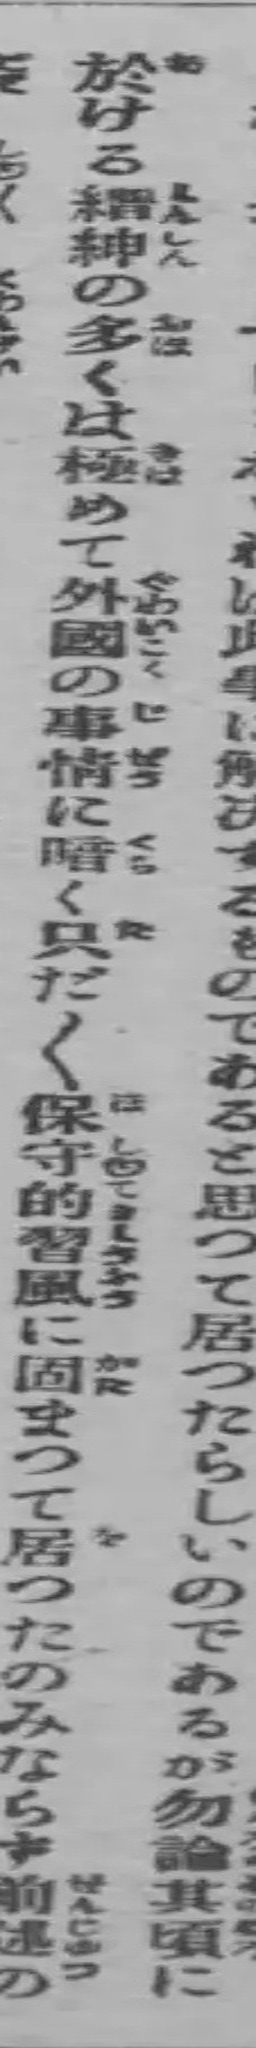於ける縉紳の多くは極めて外国の事情に暗く只だ〳〵保守的習風に固まつて居つたのみならず前述の
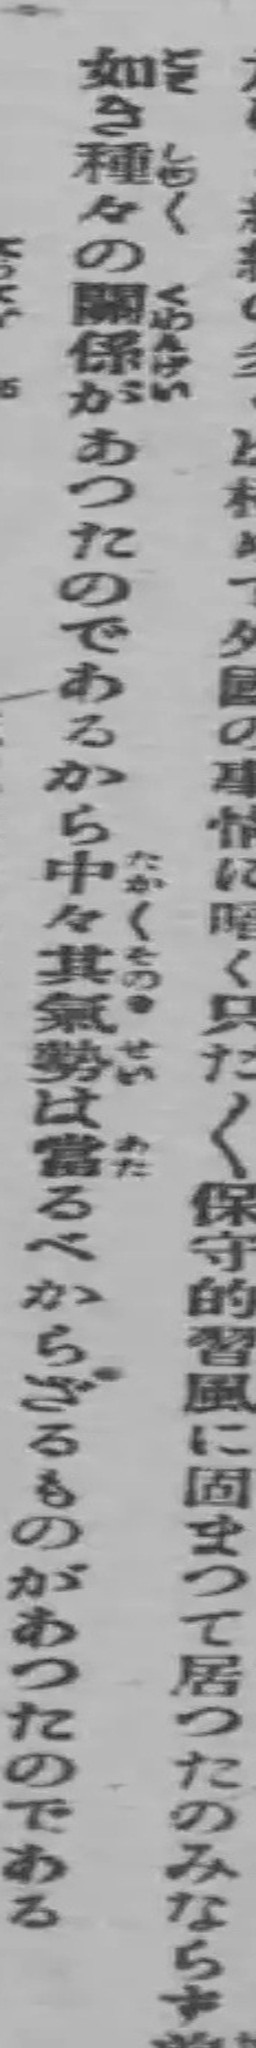如き種々の関係があつたのであるから中々其気勢は当るべからざるものがあつたのである
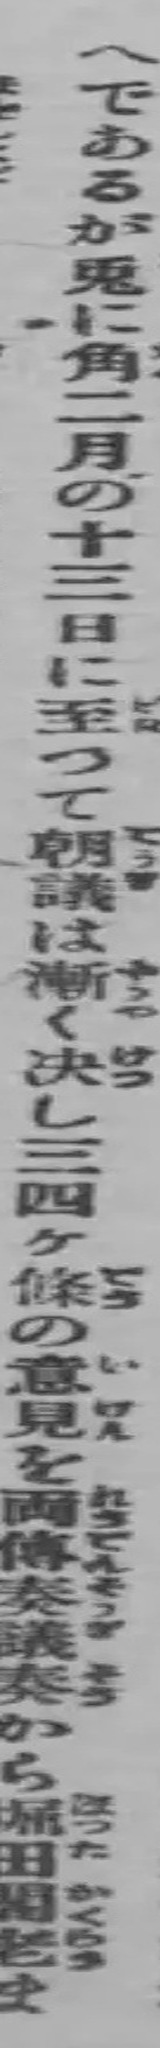へであるが兎に角二月の十三日に至つて朝議は漸く決し三四ケ条の意見を両伝奏議奏から堀田閣老ま
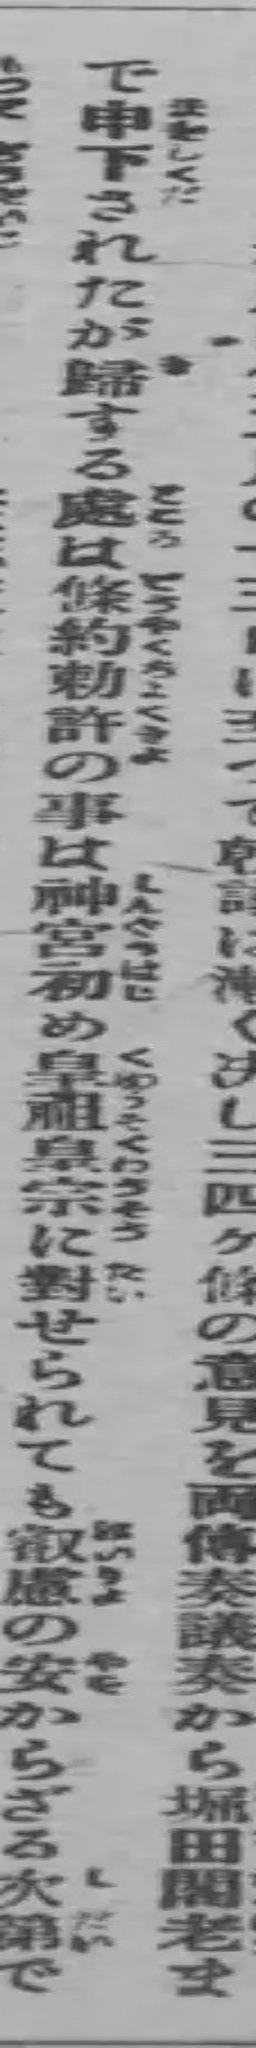で申下されたが帰する処は条約勅許の事は神宮初め皇祖皇宗に対せられても叡慮の安からざる次第で
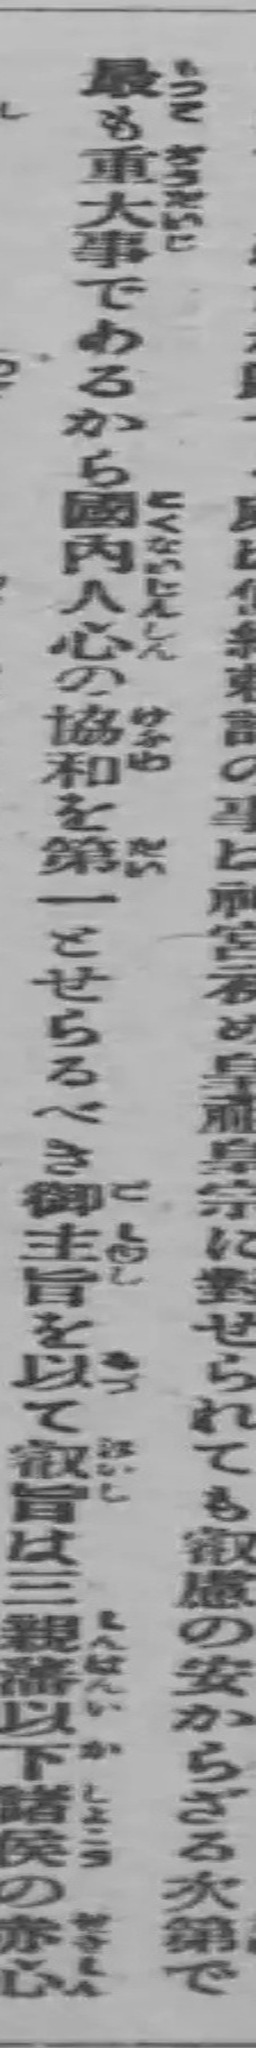最も重大事であるから国内人心の協和を第一とせらるべき御主旨を以て叡旨は三親藩以下諸侯の赤心
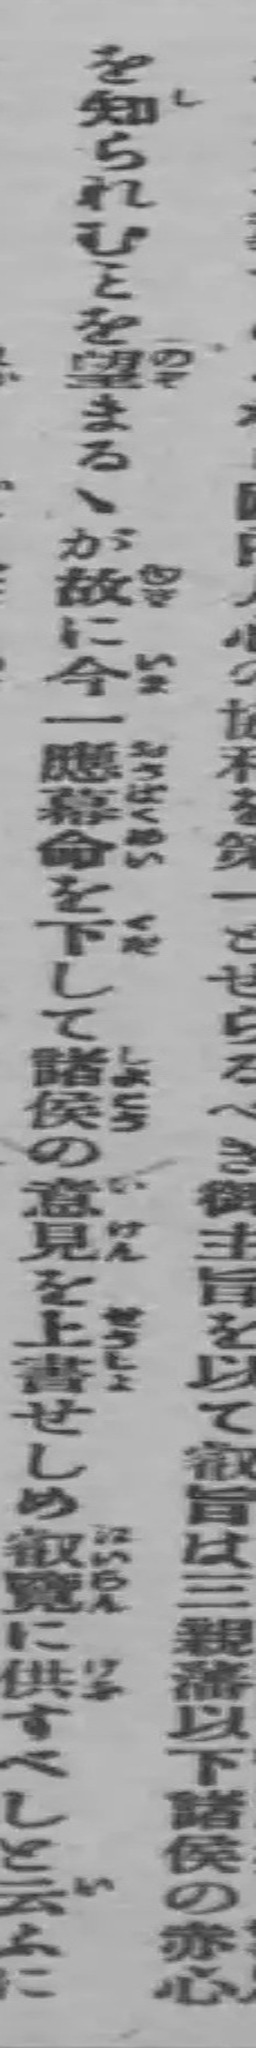を知られむことを望まるゝが故に今一応幕命を下して諸侯の意見を上書せしめ叡覧に供すべしと云ふに
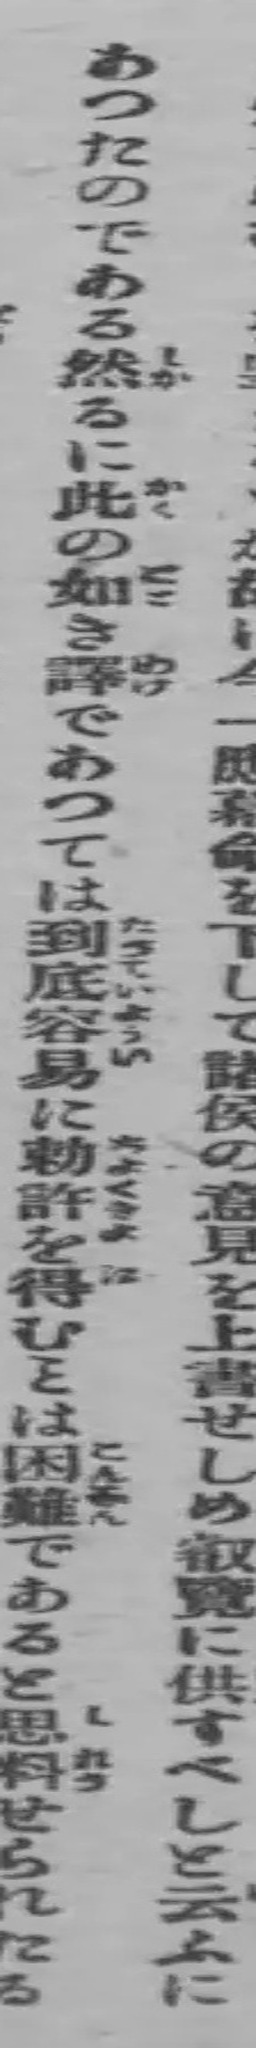あつたのである然るに此の如き訳であつては到底容易に勅許を得むことは困難であると思料せられたる
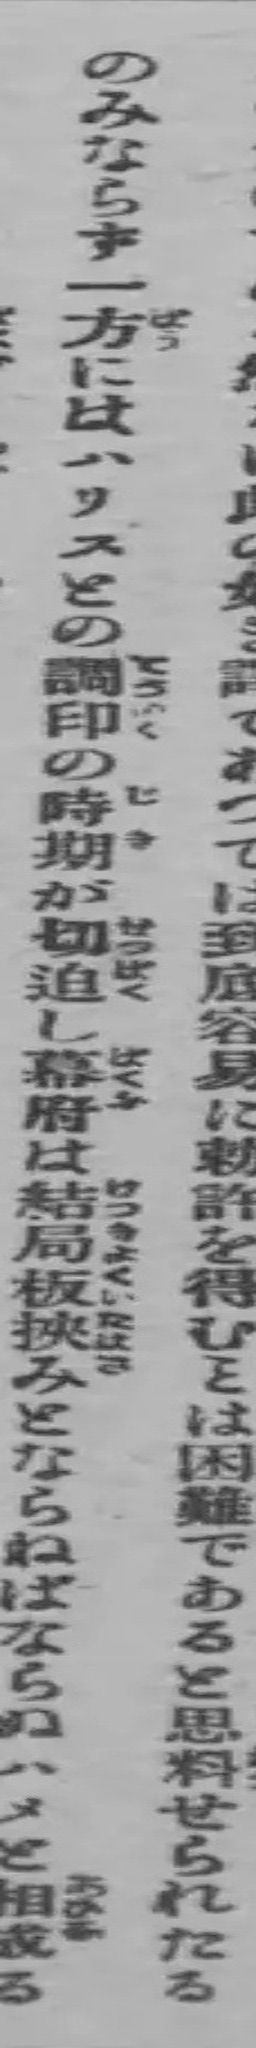のみならず一方にはハリスとの調印の時期が切迫し幕府は結局板挟みとならねばならぬハメと相成る
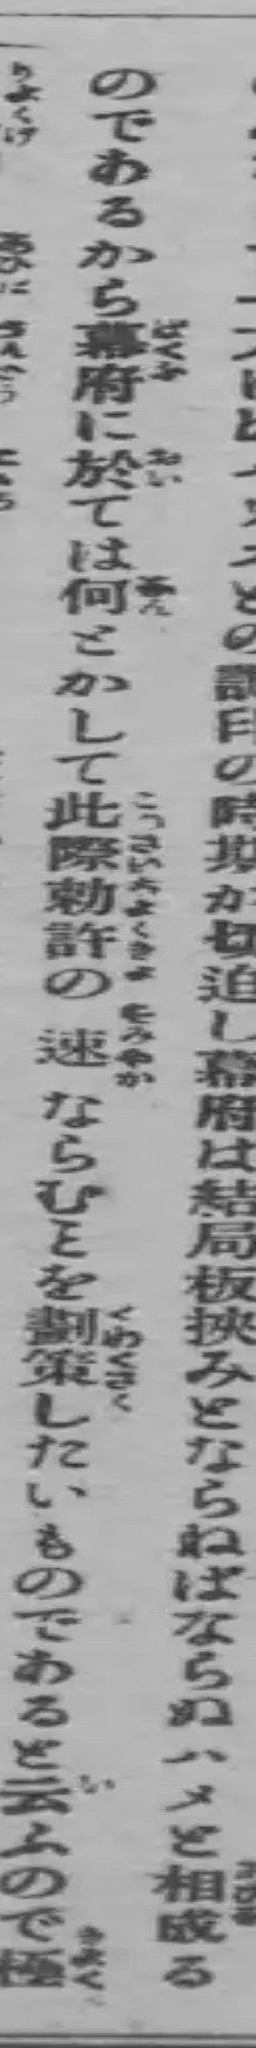のであるから幕府に於ては何とかして此際勅許の速ならむこと劃策したいものであると云ふので極
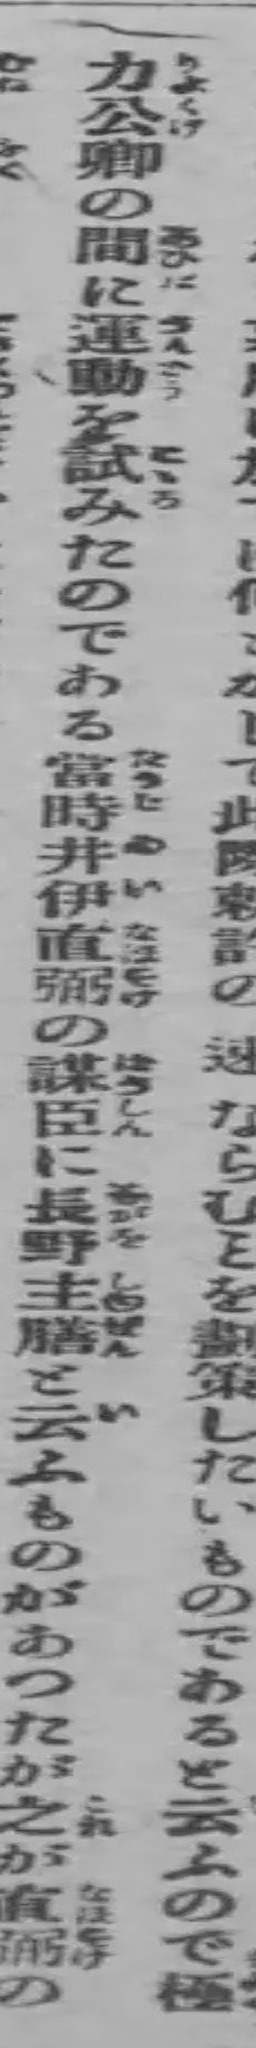力公卿の間に運動を試みたのである当時井伊直弼の謀臣に長野主膳と云ふものがあつたが之が直弼の
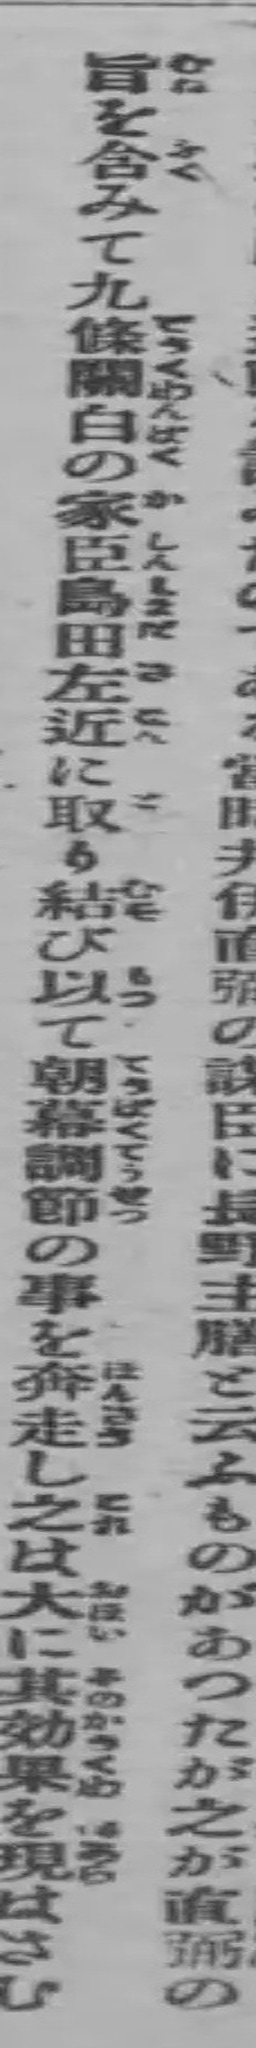旨を含みて九条関白の家臣島田左近に取り結び以て朝幕調節の事を奔走し之は大に其効果を現はさむ
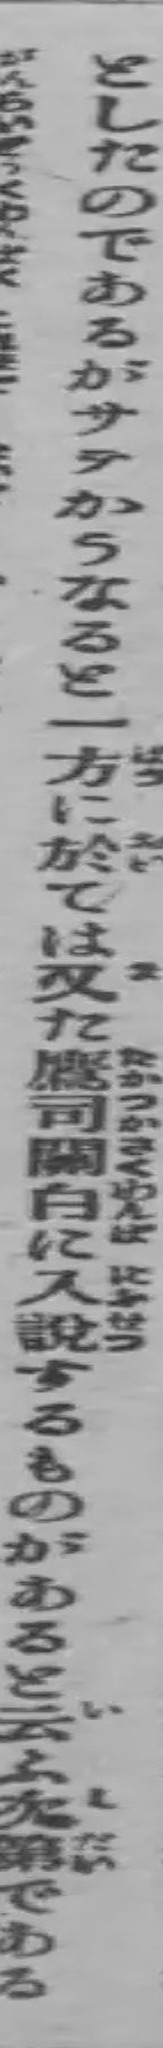としたのであるがサテかうなると一方に於ては又た鷹司関白に入説するものがあると云ふ次第である
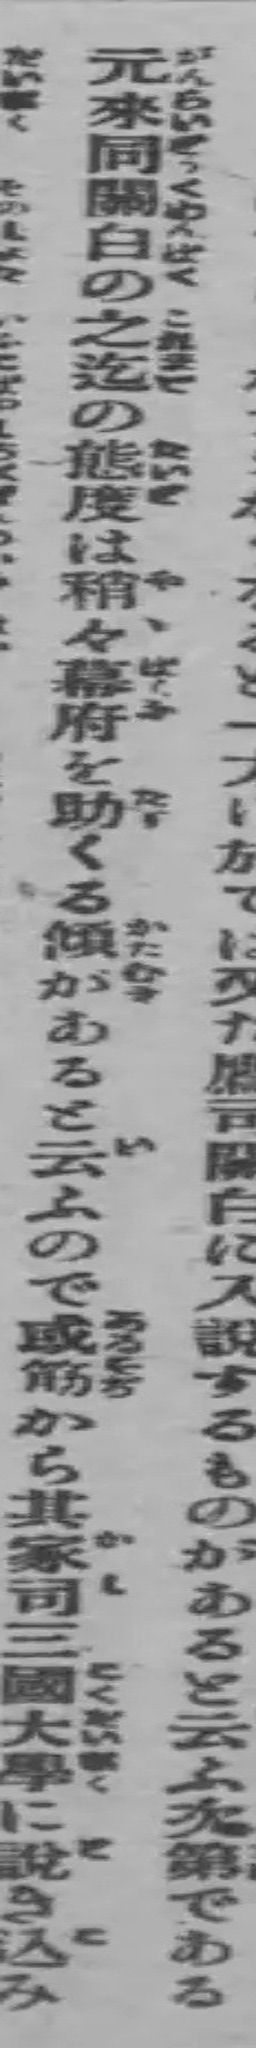元来同関白の之迄の態度は稍々幕府を助くる傾があると云ふので或筋から其家司三国大学に説き込み
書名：豊橋市史談
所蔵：国立国会図書館 National Diet Library, JAPAN
